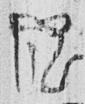祀
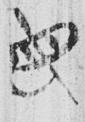母
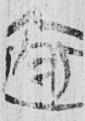衿（錦）
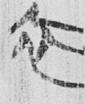衣
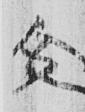交（絞）
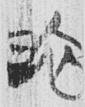袒
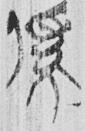○（傒）
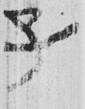子
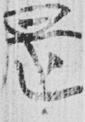是
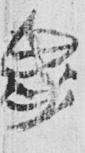{胃刀}（謂）
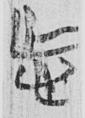忘
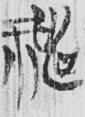神
